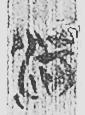河
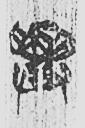䙴
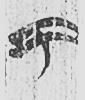于
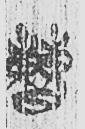曹
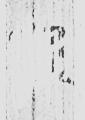𡚦
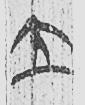立
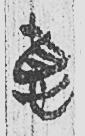惪
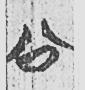公
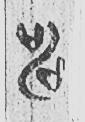申
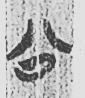公
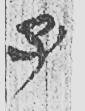子
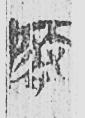啟
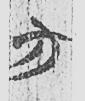方
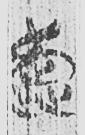奔
